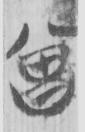曾
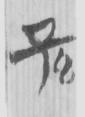孫
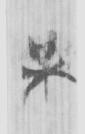某
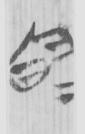{今日}=
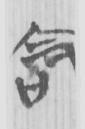命
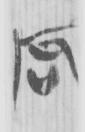唇
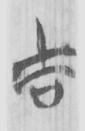吉
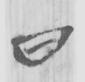日
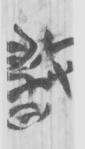敢
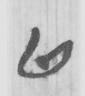㠯（以）
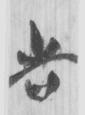告
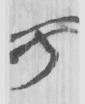于
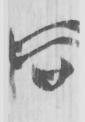后
